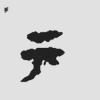亓（其）
